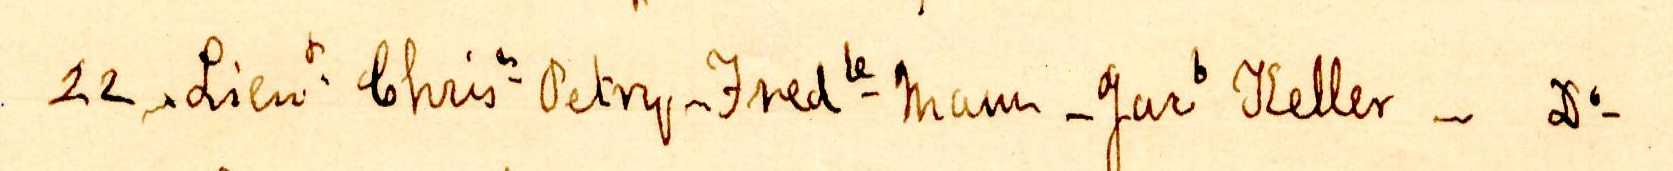22 Lieu^t. Chris^r. Petry- Fred^k- Mann- Jar^h Heller- D^o-
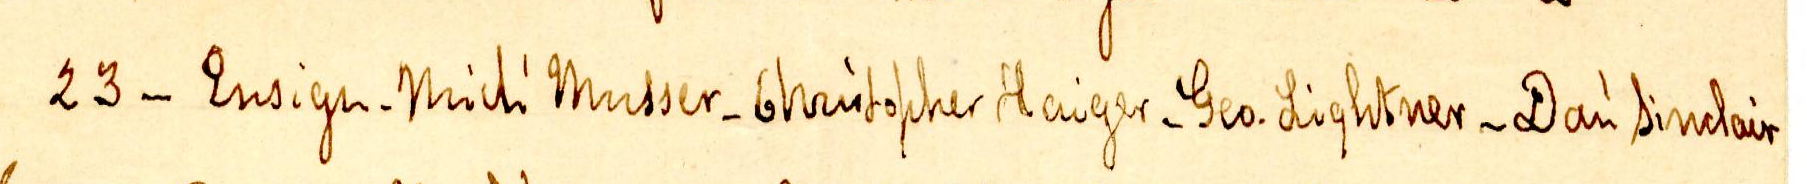23- Ensign. Mich^l Musser- Christopher Haiger- Geo. Lightner- Dan^l Sinclair
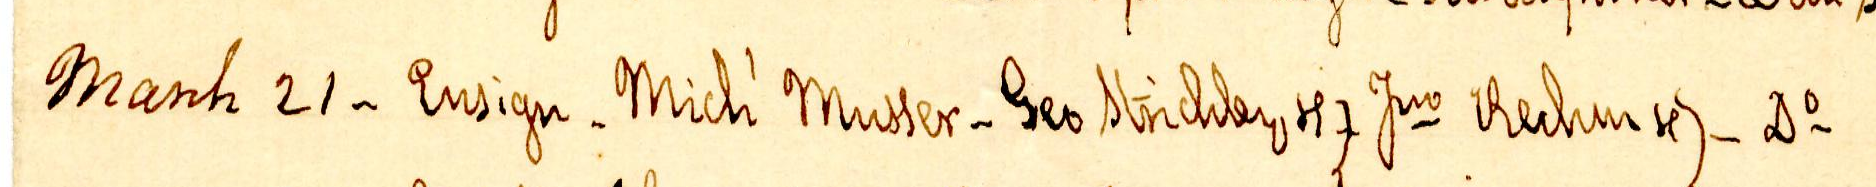March 21- Ensign. Mich^l Musser- Geo Strichley & J^no Rechurse- D^o
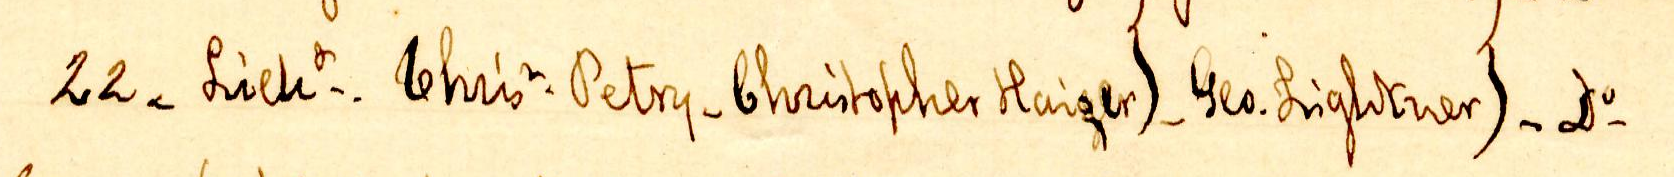22- Lick^r-. Chris^r. Petry- Christopher Haiger - Geo. Lightner - D^o
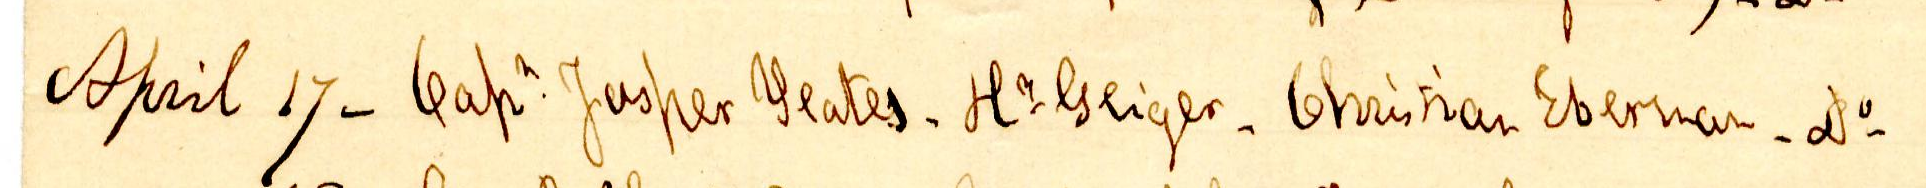April 17- Cap^n. Jasper Yeates- H^r Geiger- Christian Eberman- D^o
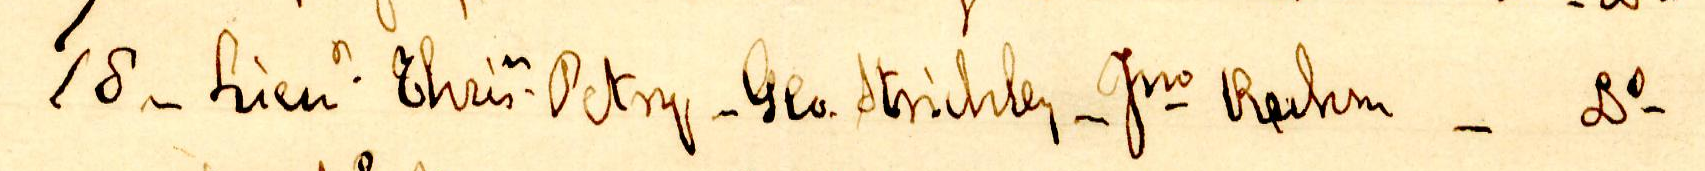18- Lieu^n. Chris^r Petry- Geo. Strichley- J^no Rechum- D^o
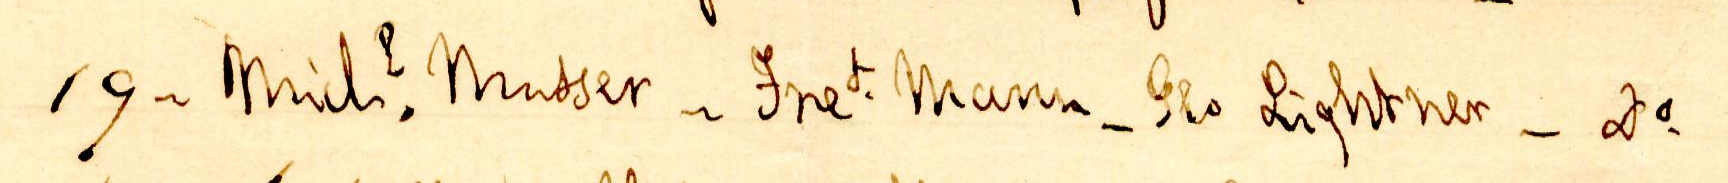19- Mich^l. Musser- Fre^d. Mann- Geo Lightner- D^o.
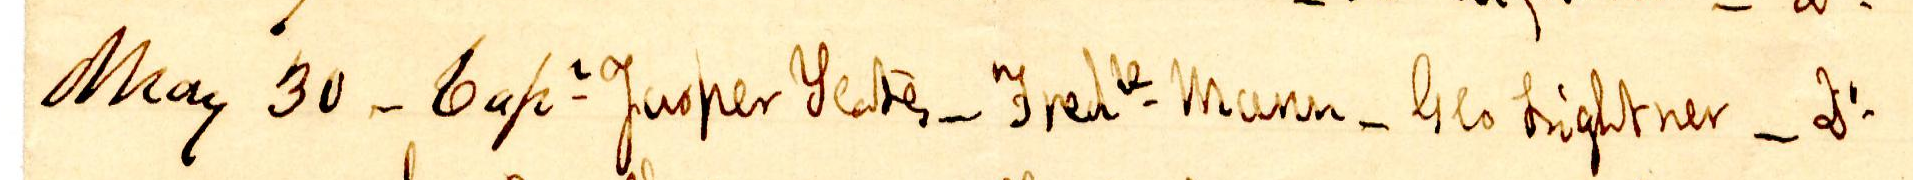May 30- Cap^n Jasper Yeates- Fred^k Mann- Geo Lightner- D^o.
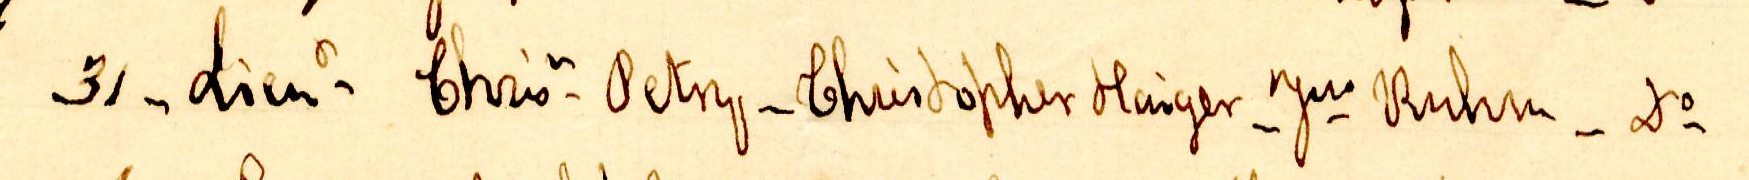31- Lieu^n- Chris^r Petry- Christopher Haiger- Jas Ruhan- D^o
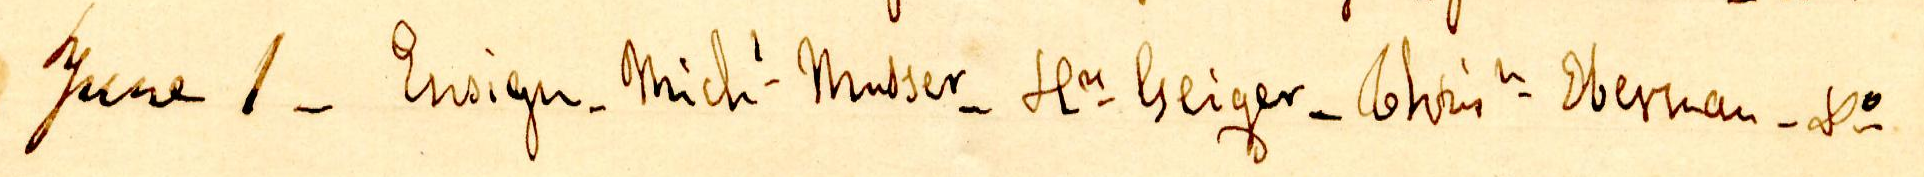June 1- Ensign Mich^l- Musser- H^n Geiger- Chris^r Oberman- D^o
